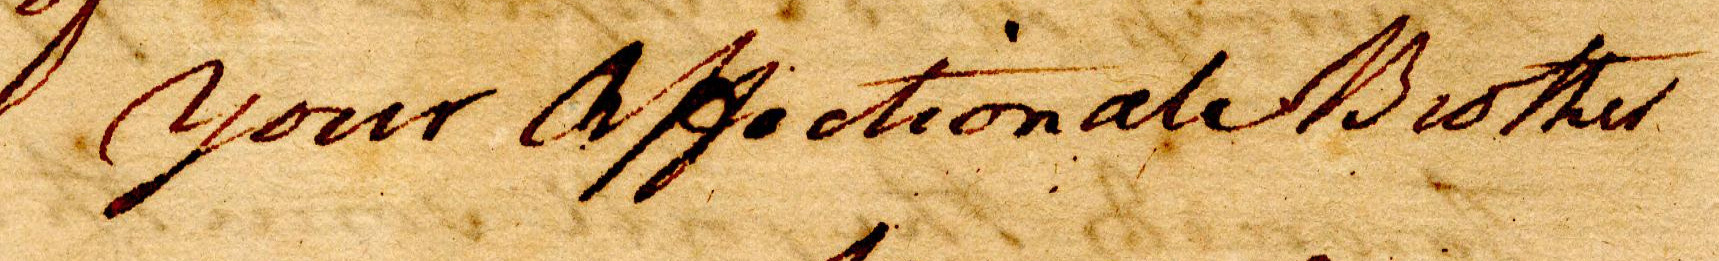Your Affectionate Brother
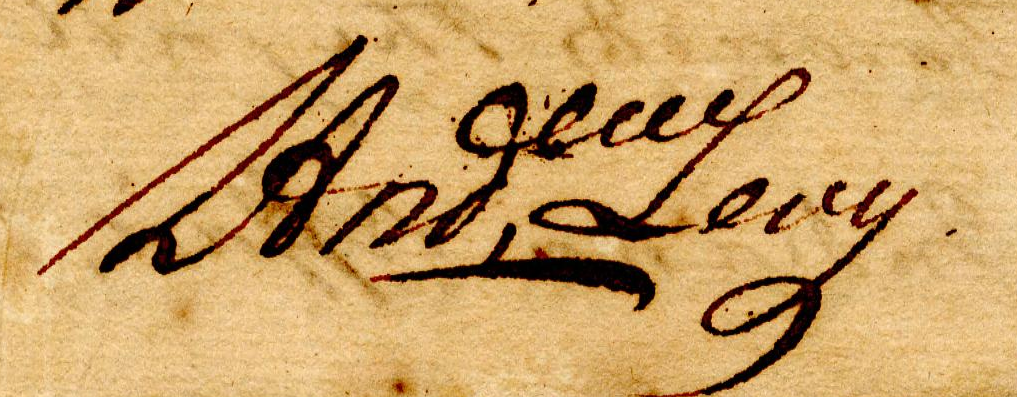And^rew Levy
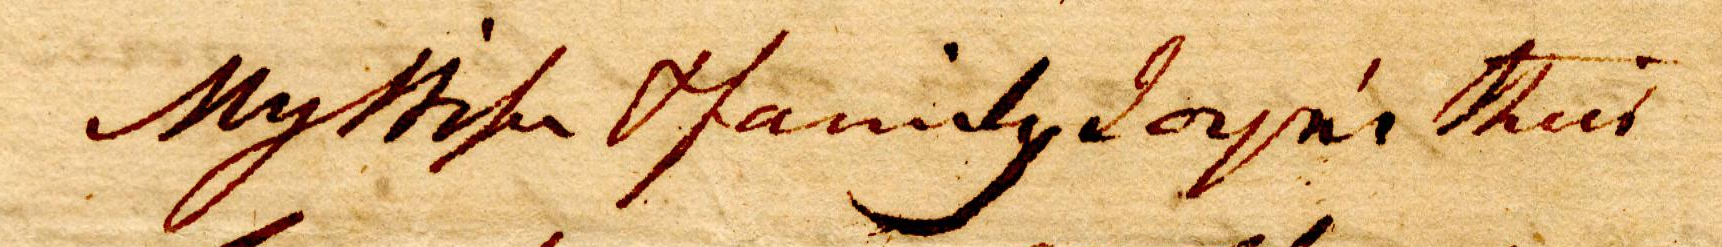My wife & family Joyn's their
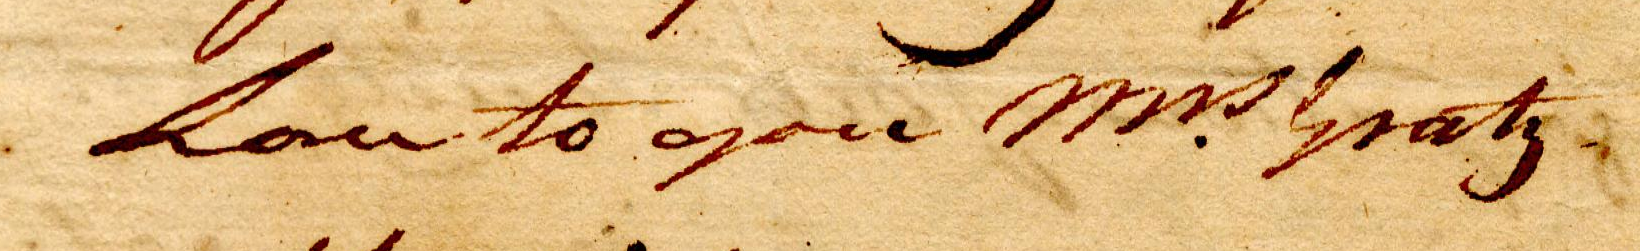love to you M^rs. Gratz
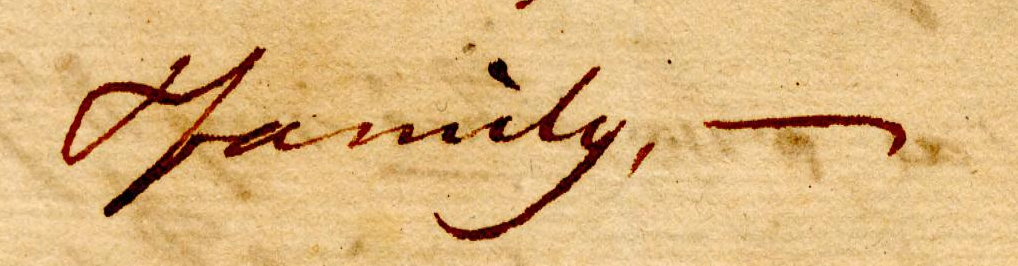family.-
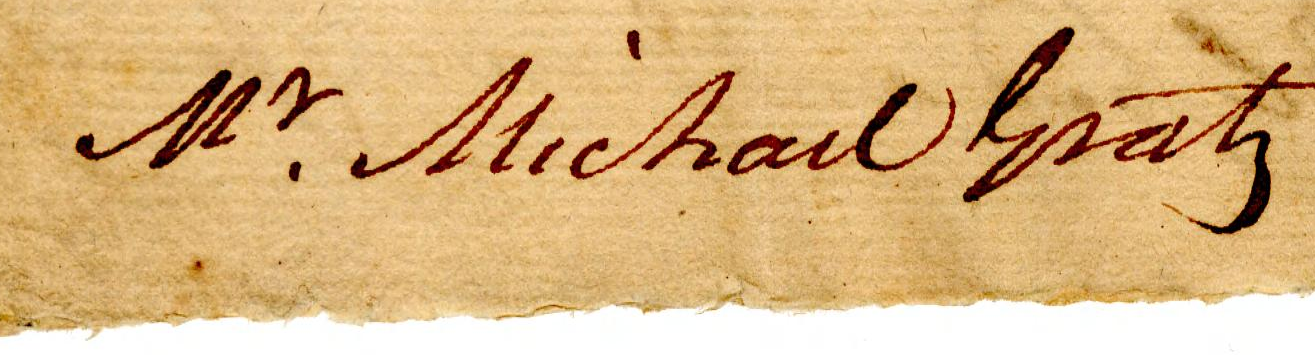M^r. Michael Gratz
